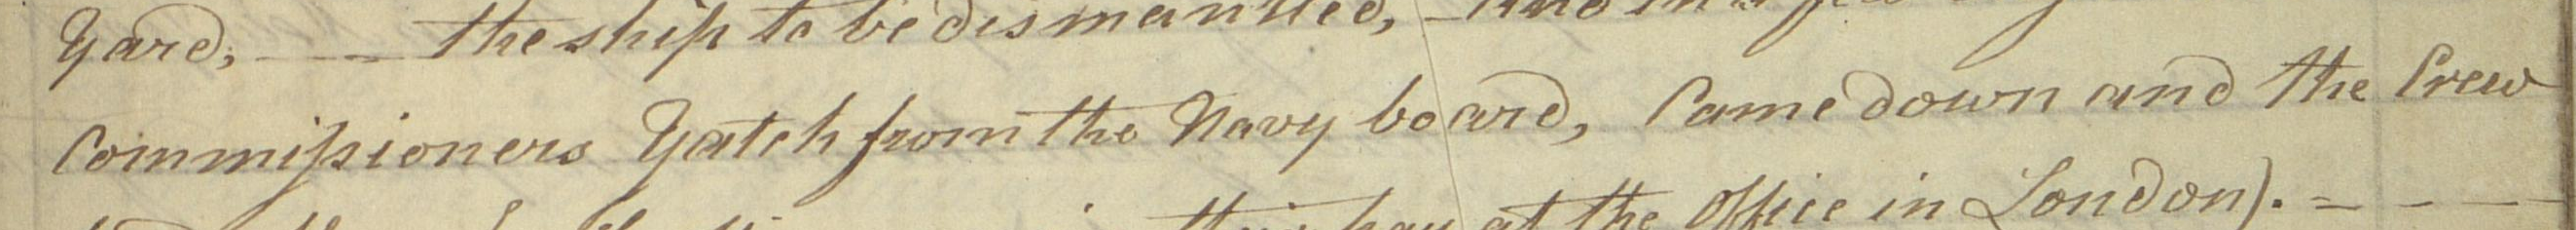Commissioners Yatch from the Navy board, Came down and the Crew
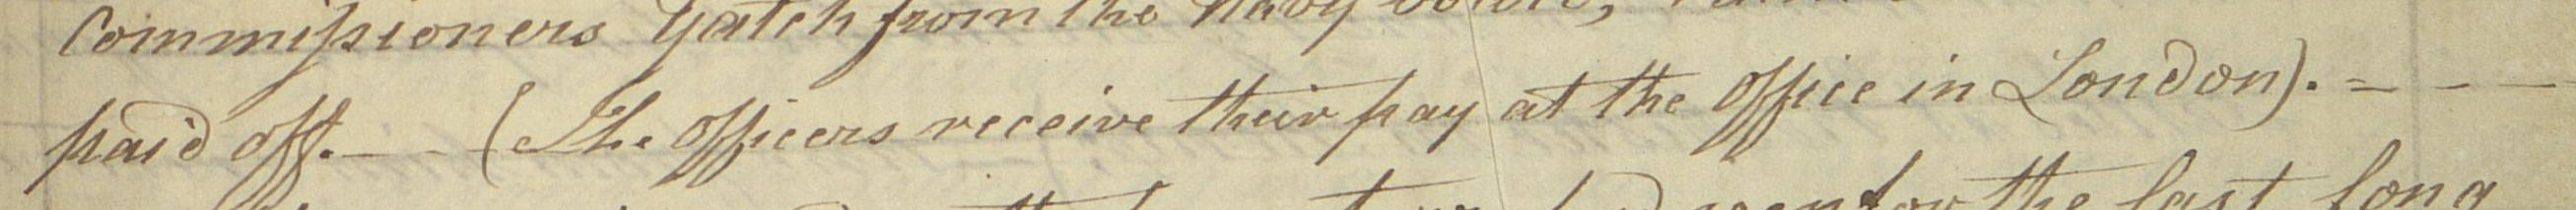paid off. (The Officers receive their pay at the Office in London).
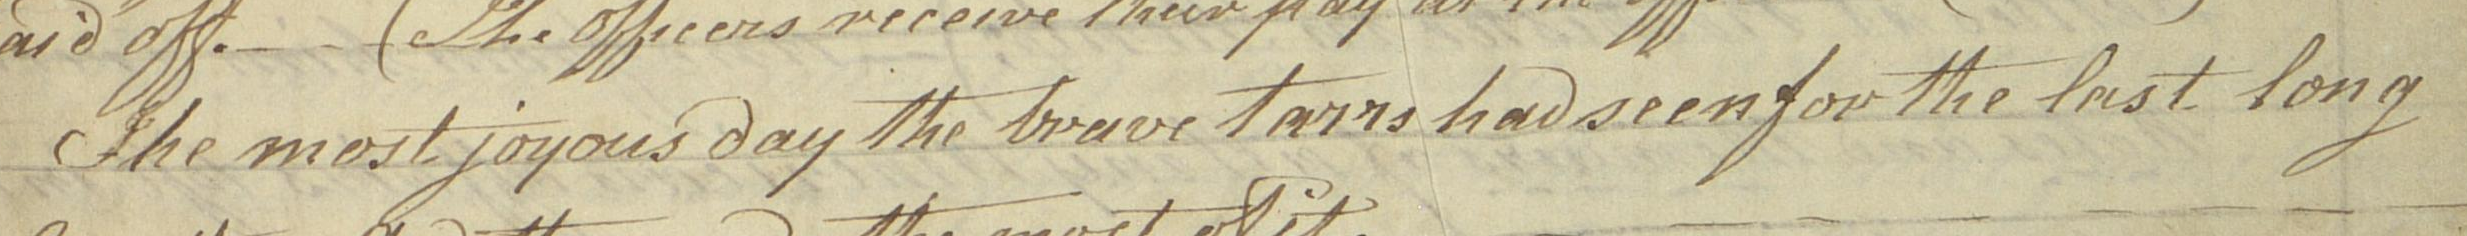The most joyous day the brave tarrs had seen for the last long
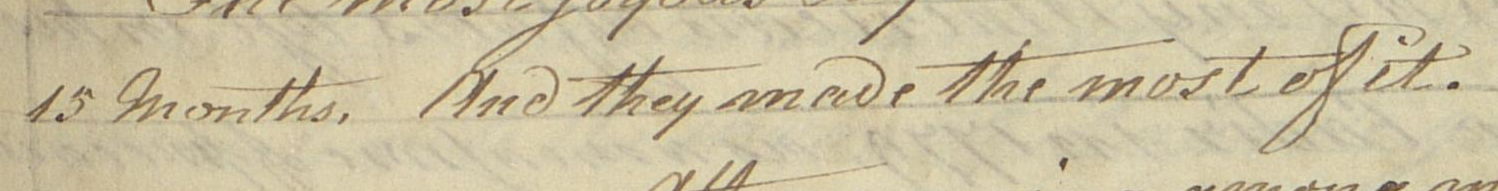15 months. And they made the most of it.
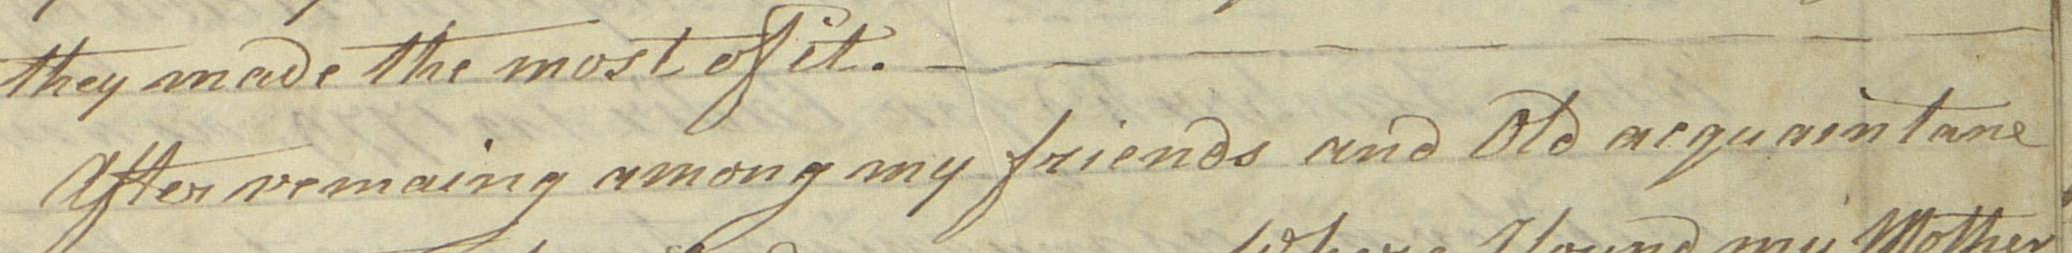After remaing among my friends and Old acquaintane
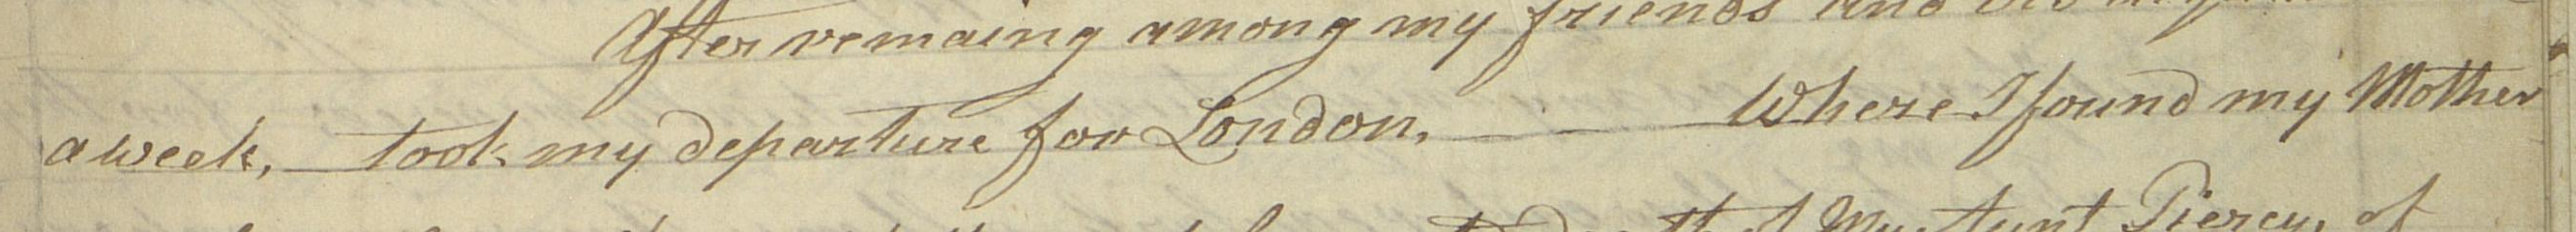a week, took my departure for London, Where I found my Mother
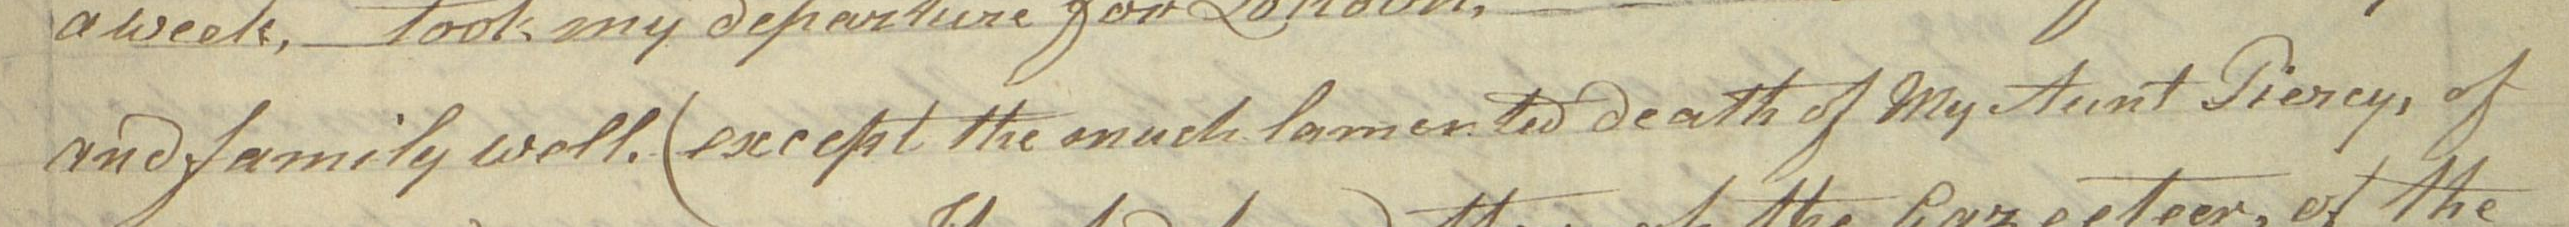and family well. (except the much lamented death of My Aunt Piercy, of
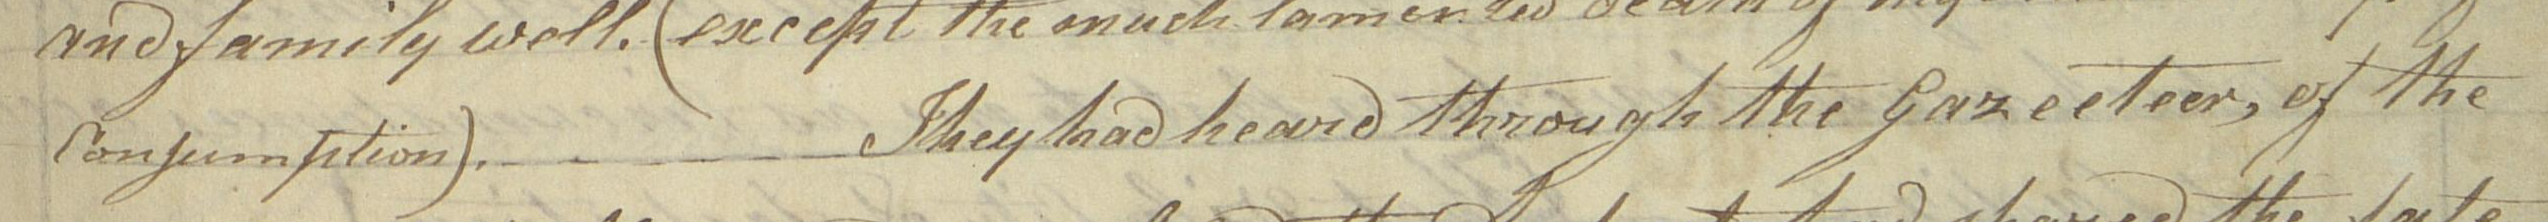Consumpition). They had heard through the Gazeeteer, of the
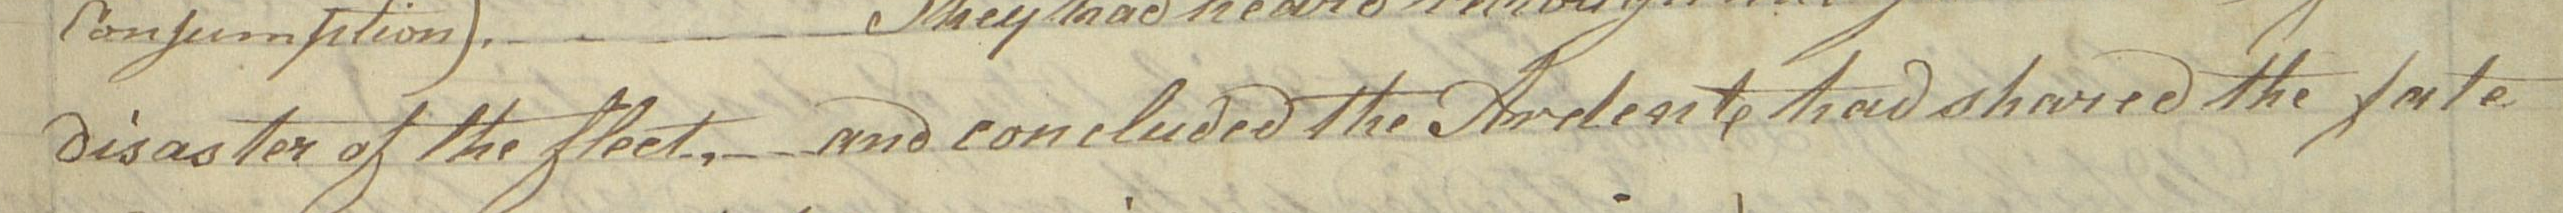disaster of the fleet, and concluded the Ardent had shared the fate
